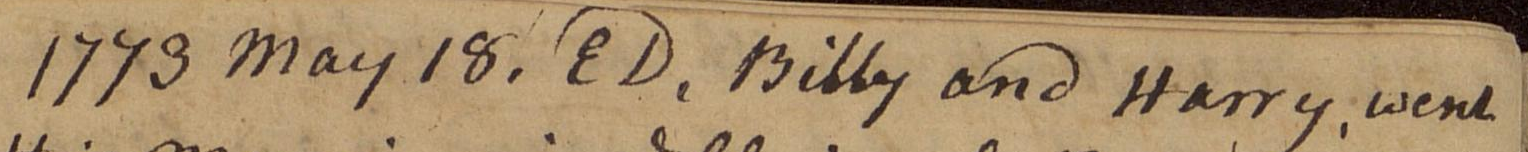1773 May 18. ED. Billy and Harry, went
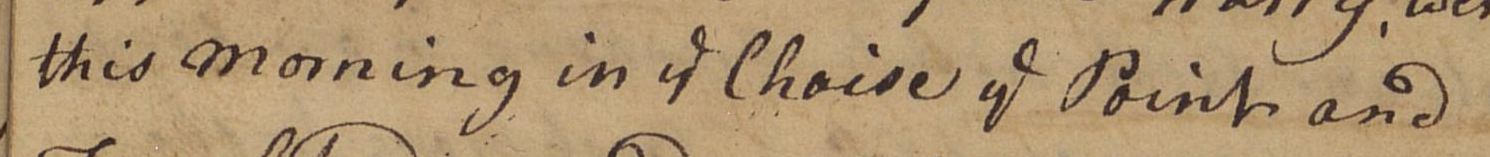this morning in y^e Chaise y^e Point and
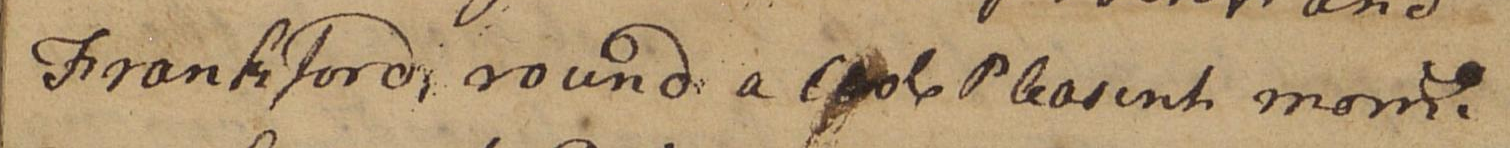Frankford round a C[o]ol Pleasent morn^g.
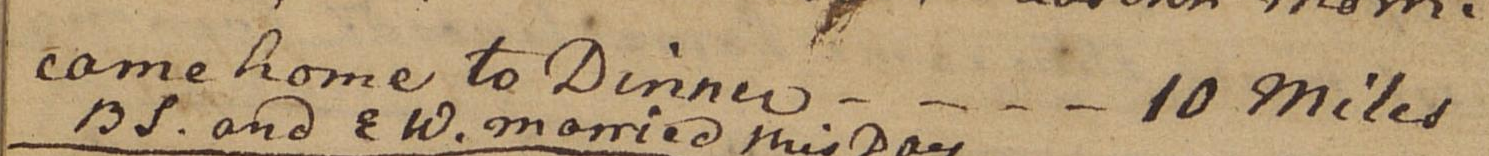came home to Dinner ---- 10 Miles
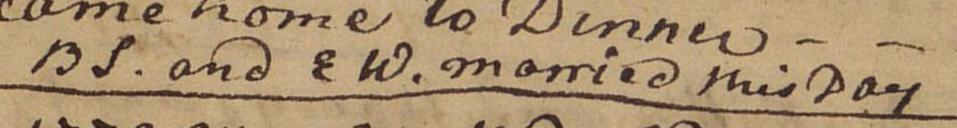BS. and EW. married this Day
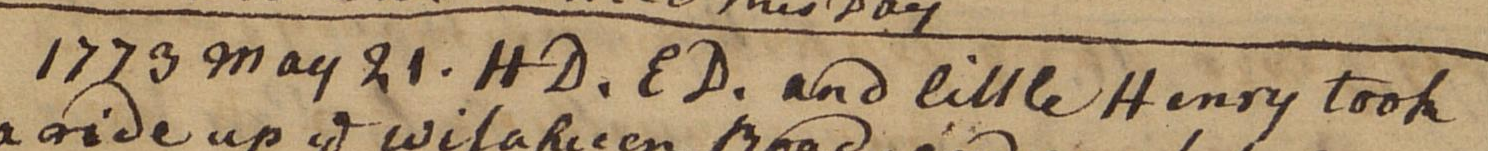177 3 May 21. HD. E D. and little Henry took
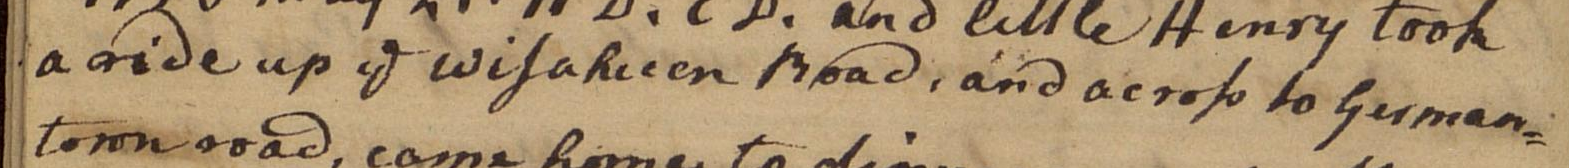a ride up y^e Wisahicen Road, and across to German-
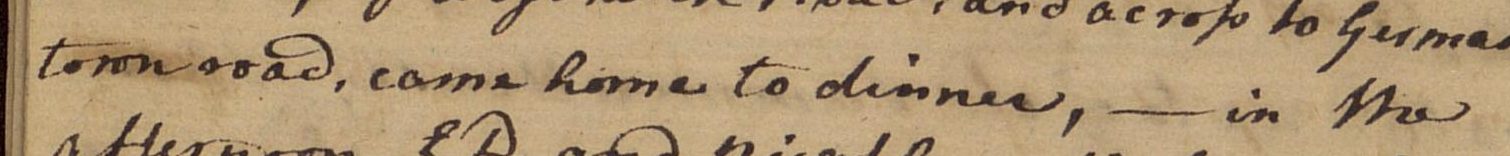town road, came home to dinner,- in the
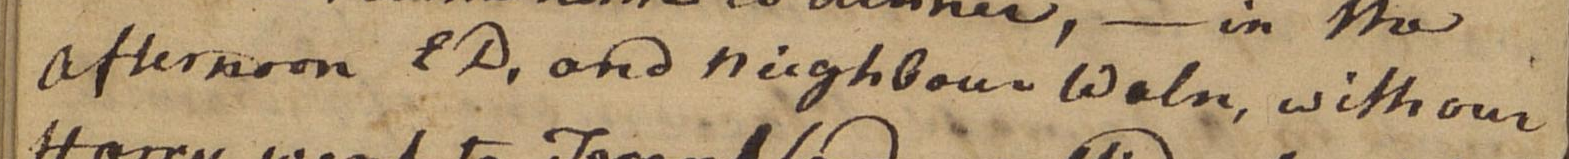afternoon ED. and Neighbour Waln, with our
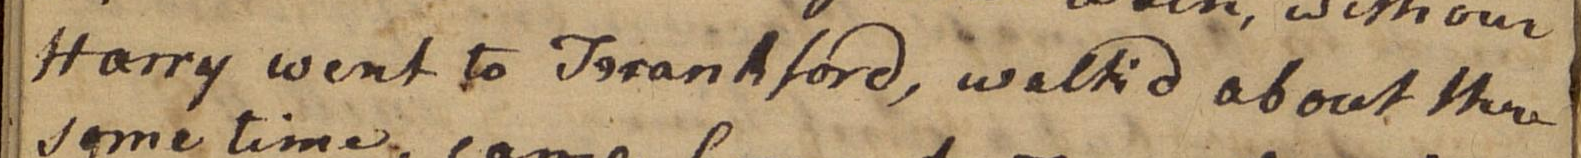Harry went to Frankford, walk'd about there
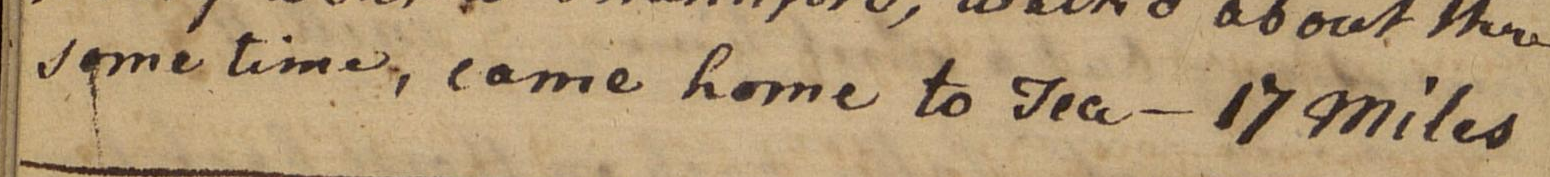some time, came home to Tea- 17 Miles
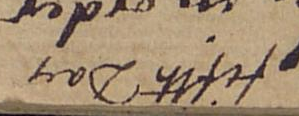fifth Day
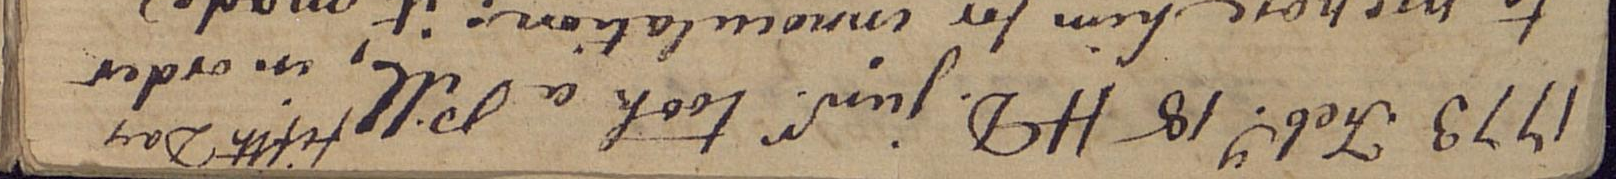1773 Feb^y. 18 HD. jun^r took a Pill, in order
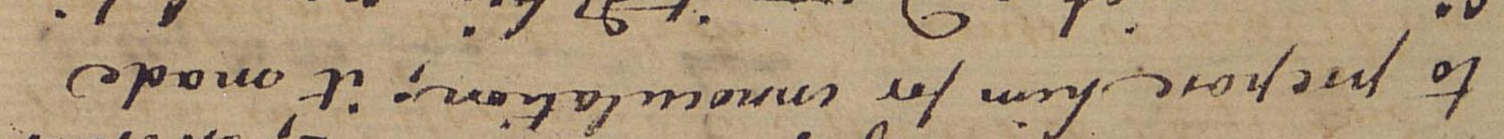to prepose him for innoculation; it made
